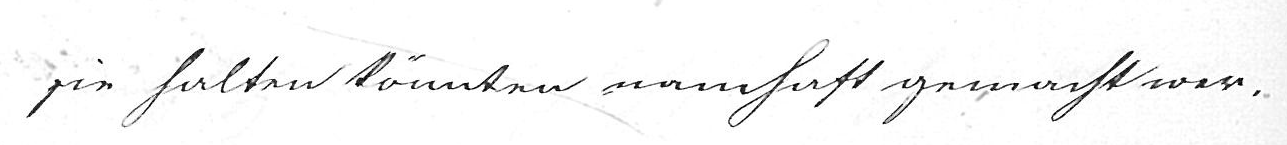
sie halten könnten namhaft gemacht wer-
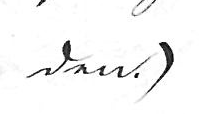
den.)
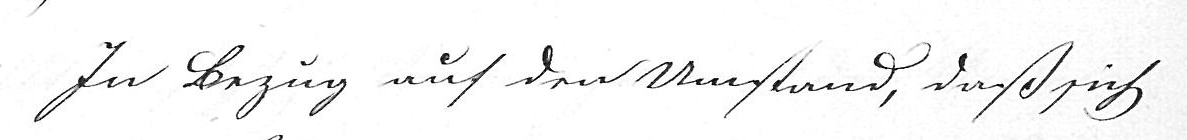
In Bezug auf den Umstand, daß sich
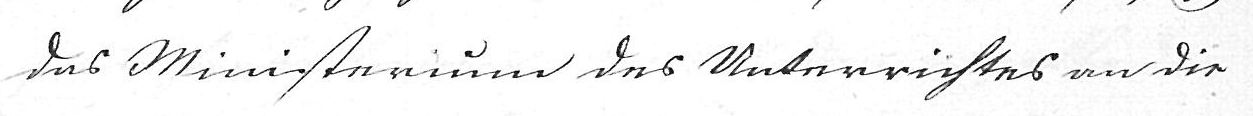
das Ministerium des Unterrichtes an die
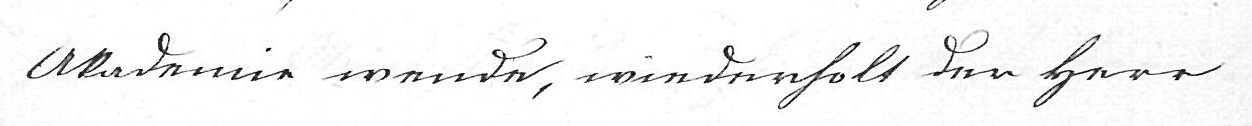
Akademie wende, wiederholt der Herr
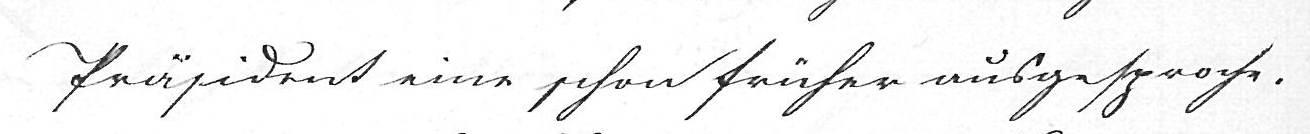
Präsident eine schon früher ausgesproche-
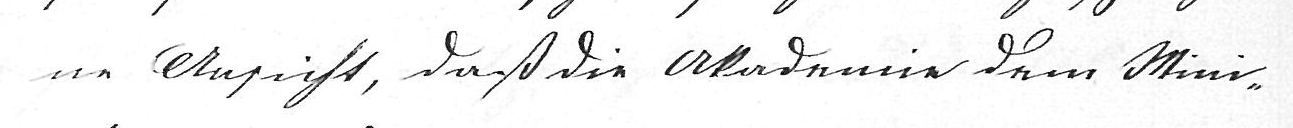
ne Ansicht, daß die Akademie dem Mini-
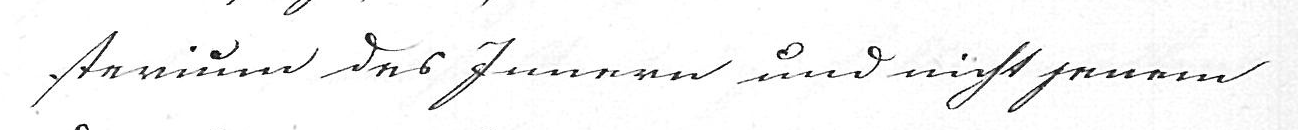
sterium des Innern und nicht jenem
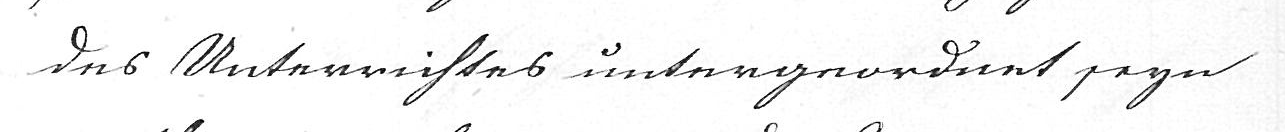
des Unterrichte untergeordnet seyn
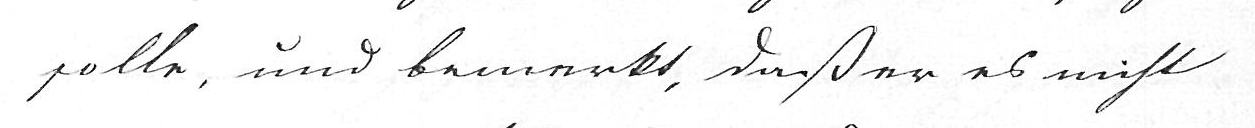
solle, und bemerkt, daß er es nicht
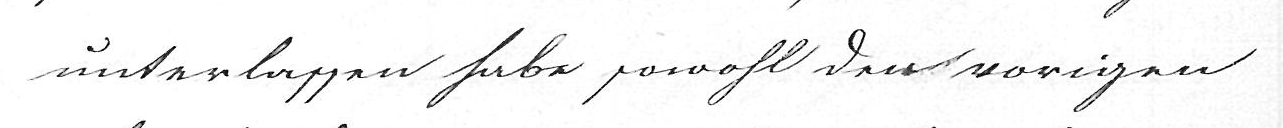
unterlassen habe sowohl den vorigen
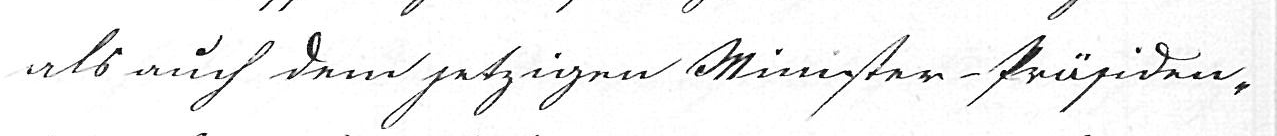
als auch dem jetzigen Minister-Präsiden-
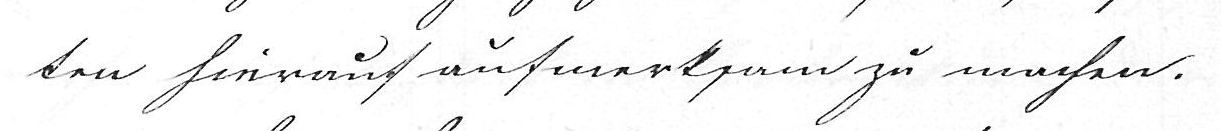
ten hierauf aufmerksam zu machen.
